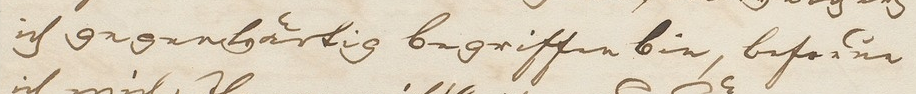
ich gegenwärtig begriffen bin, befreue
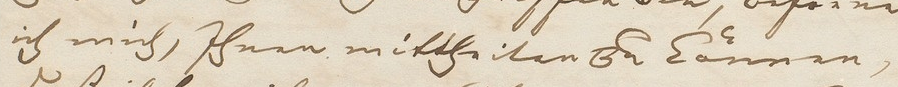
ich mich, Ihnen mittheilen zu können,
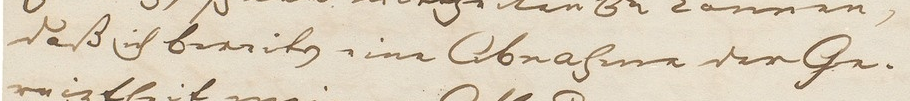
daß ich bereits eine Abnahme der Ge-
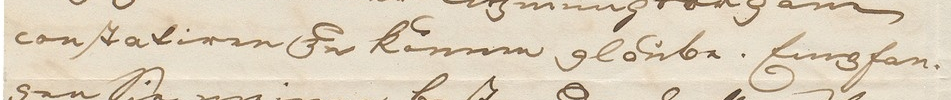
constatiren zu können glaube. Empfan-
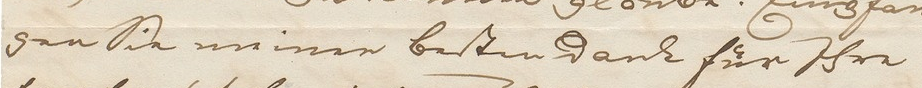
gen Sie meinen besten Dank für Ihre
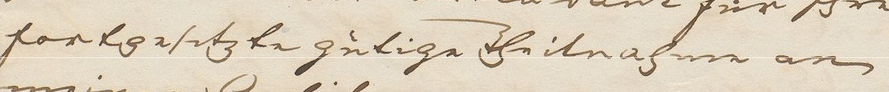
fortgesetzte gütige Theilnahme an
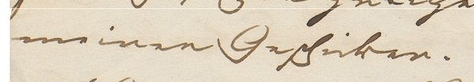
meinen Geschicken.
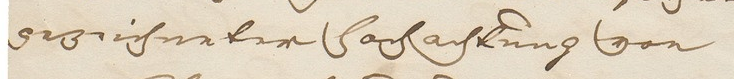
gezeichneter Hochachtung von
